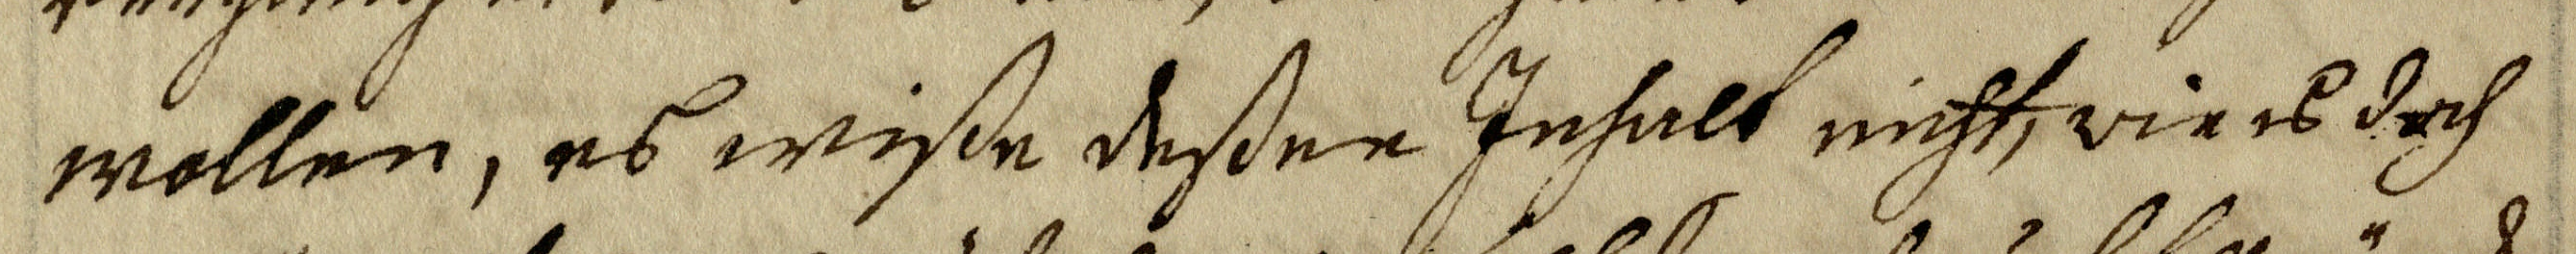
wollen, es wiße dessen Inhalt nicht, wie es doch
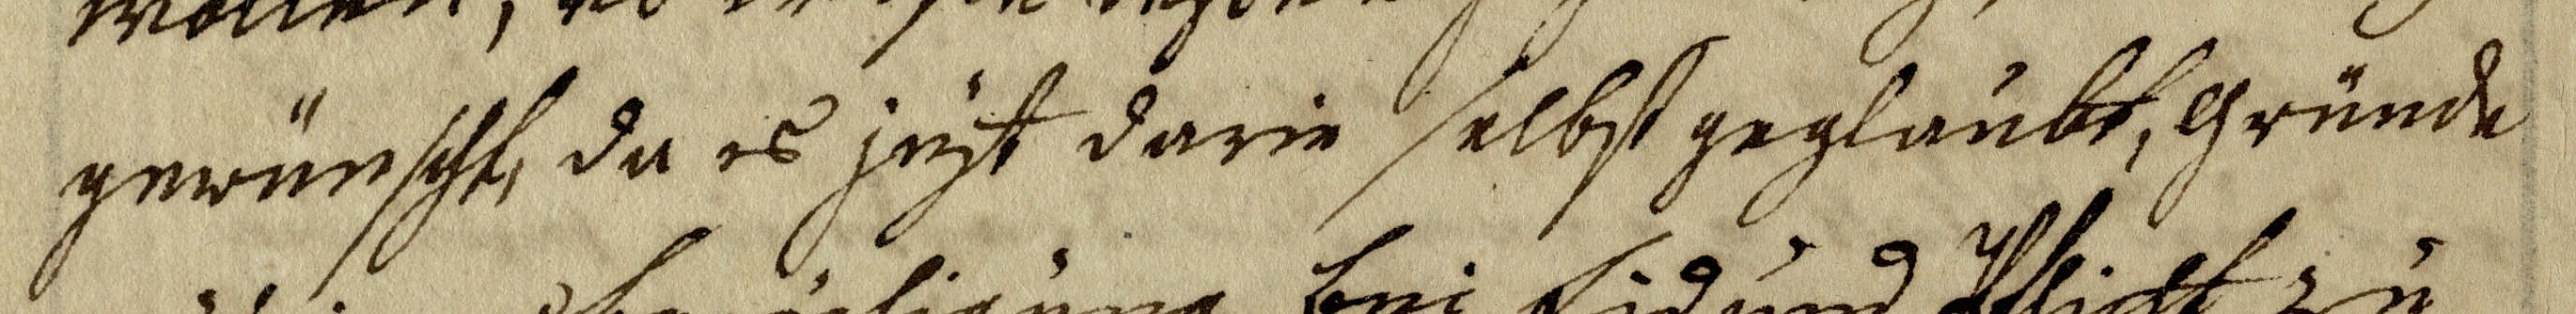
gewünscht, da es jezt darin selbst geglaubt, Gründe
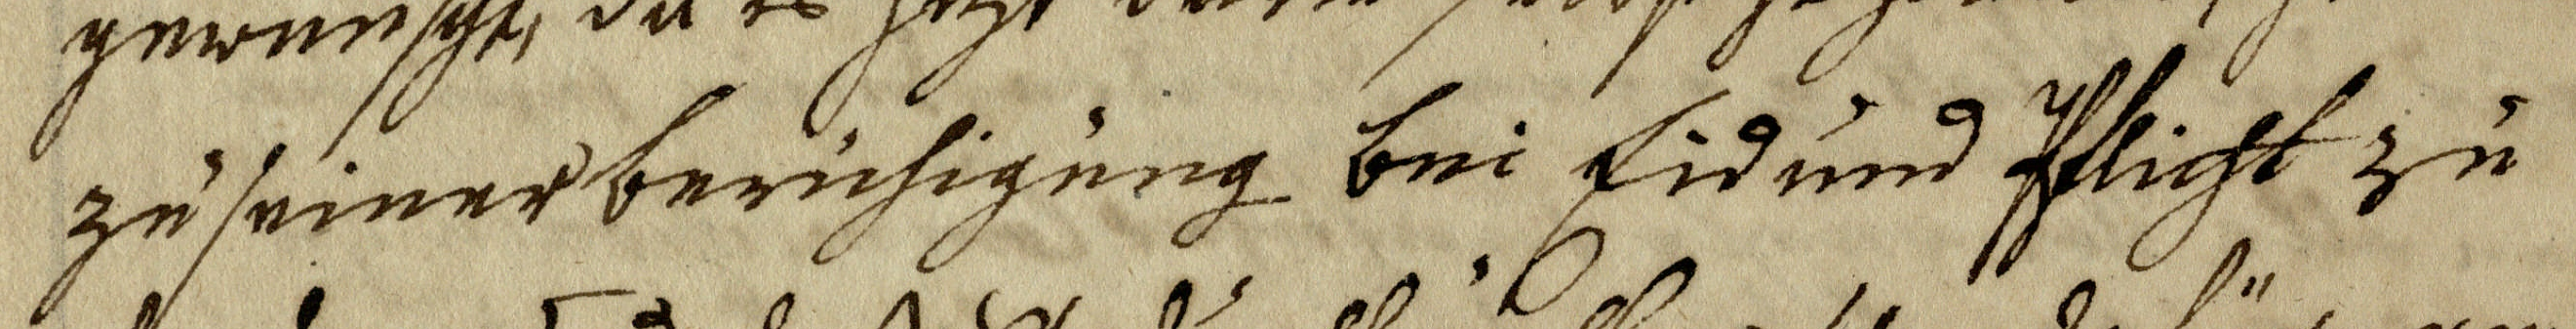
zu seiner Berichtigung bei Eid und Pflicht zu
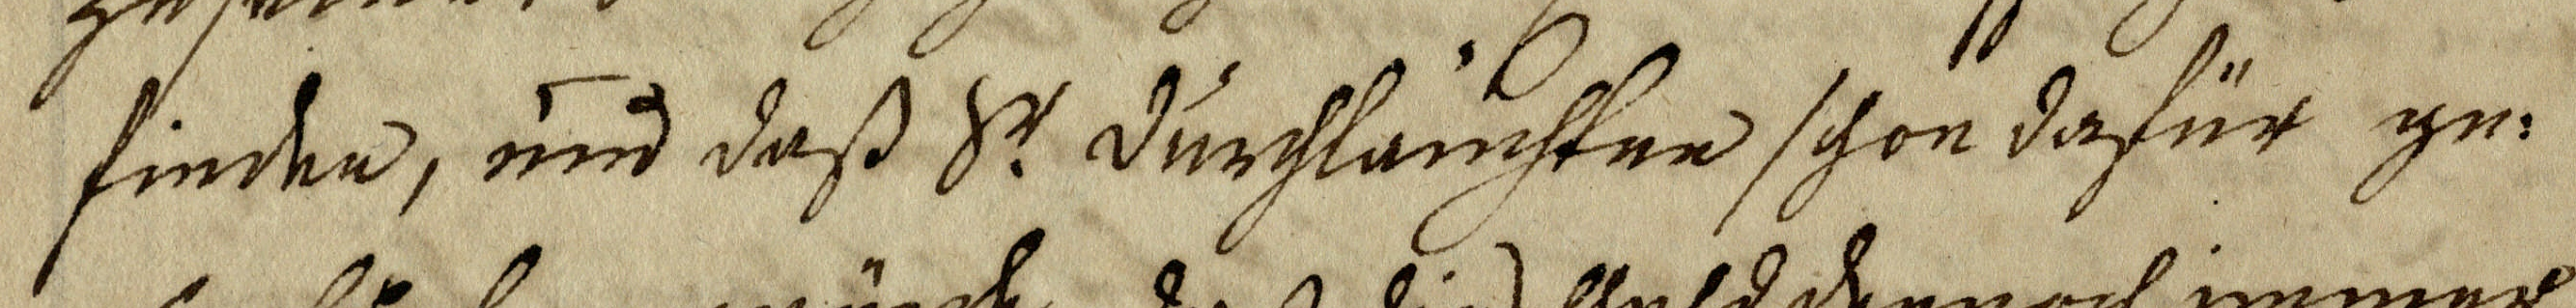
finden, und daß Sr Durchlauchten schon dafür ge¬
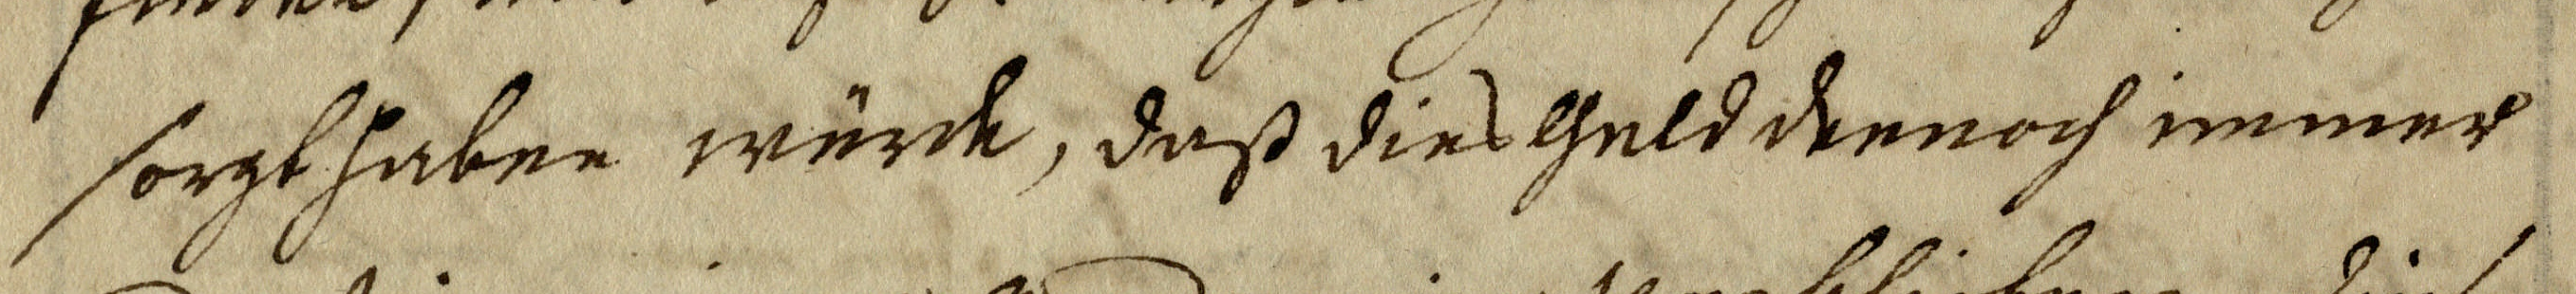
sorgt haben würde, daß dies Geld dennoch immer
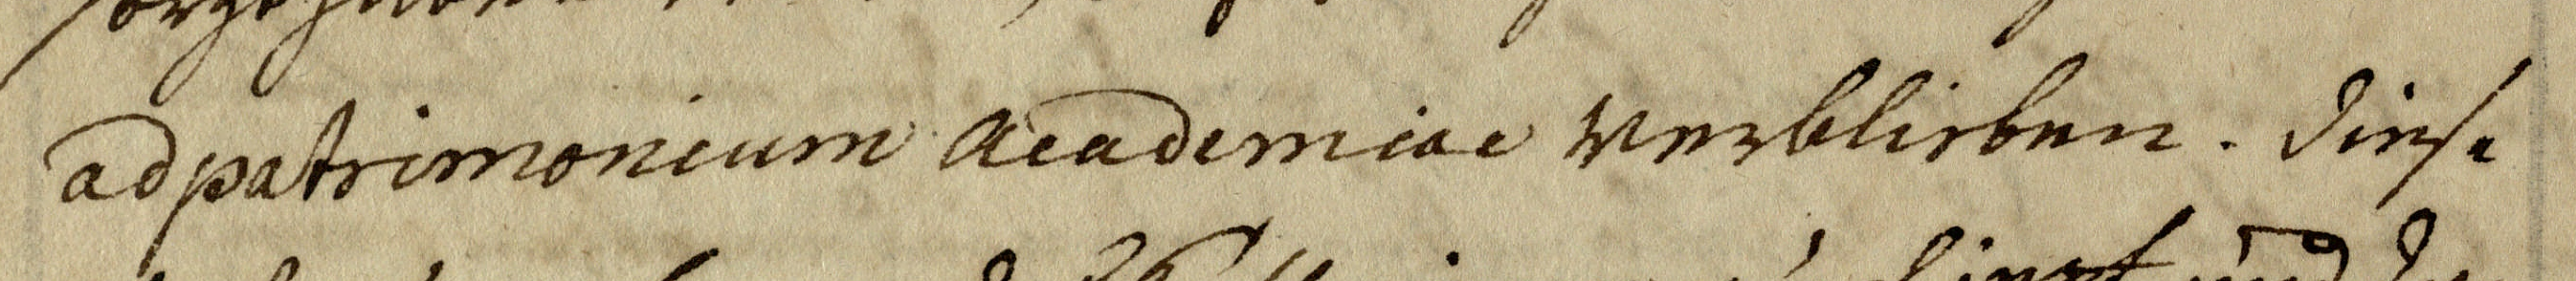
ad patrimonium Academiae verbleiben. Diese
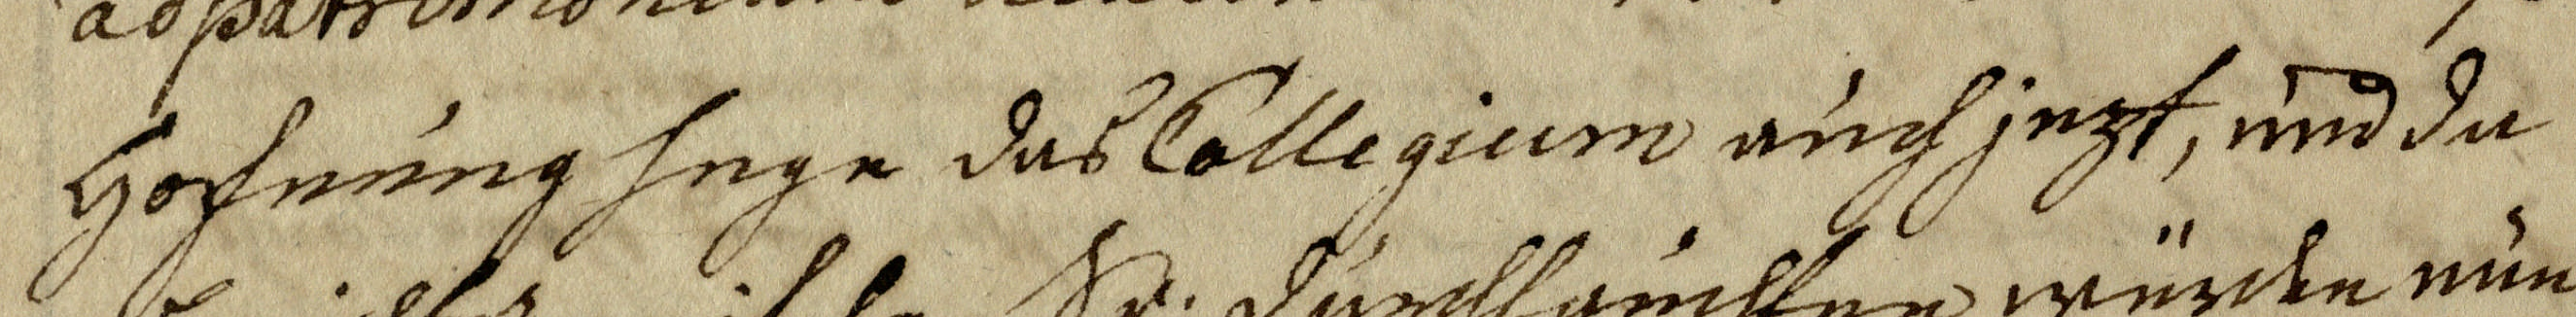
Hofnung hagen das Collegium auch jezt, und da
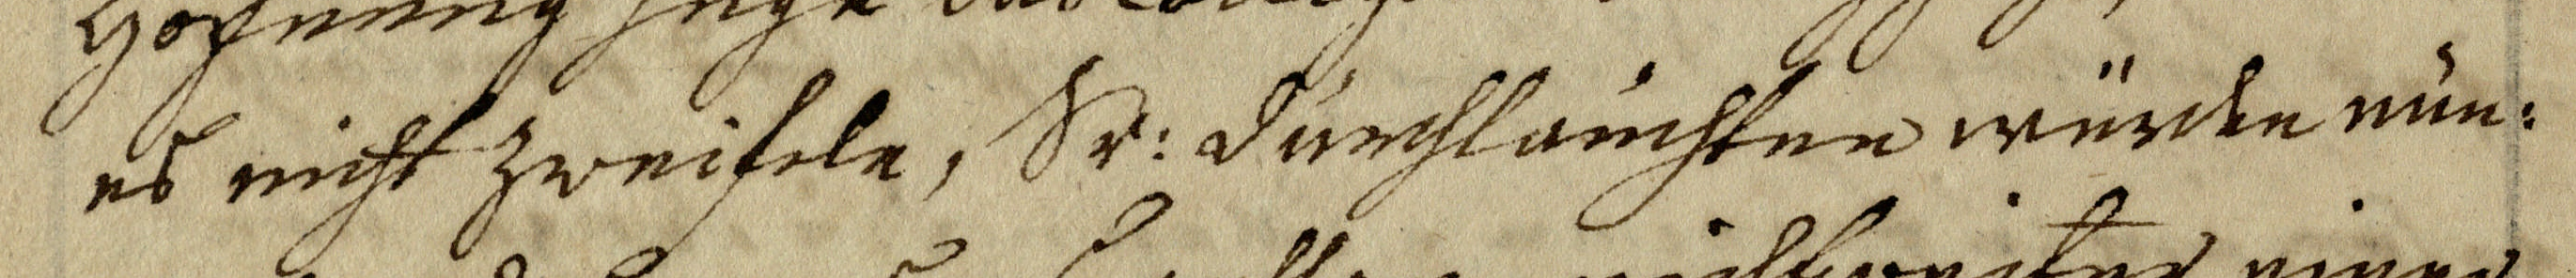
es nicht zweifele, Sr. Durchlauchten würden nun¬
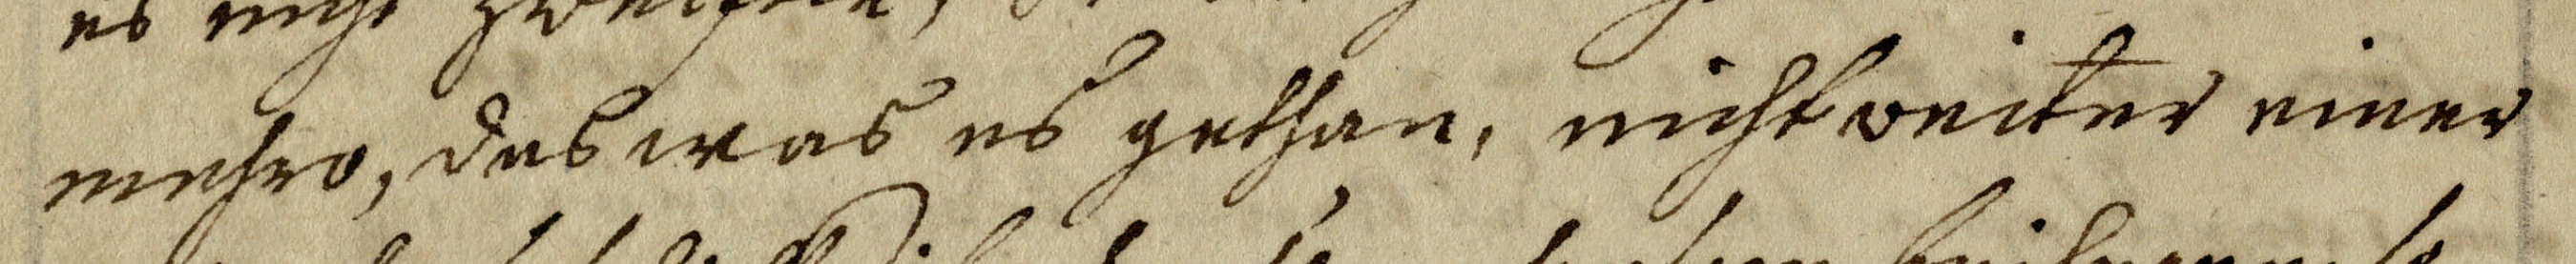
mehro, das was es gethan, nicht weiter einer
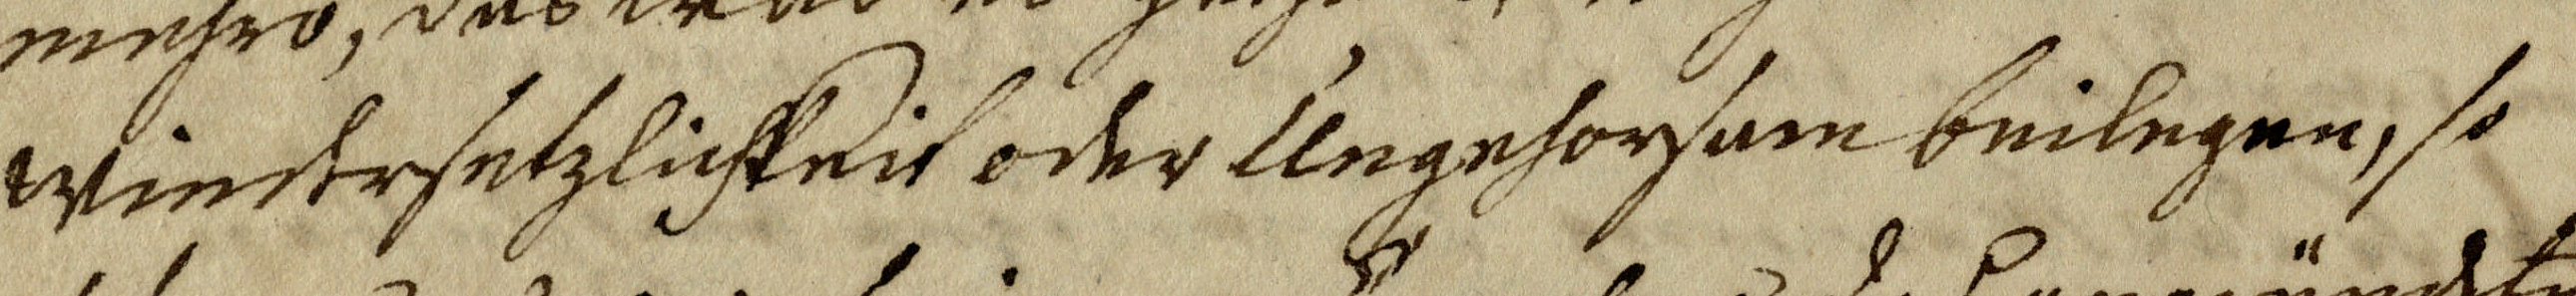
Wiedersetzlichkeit oder Ungehorsam beilegen, so
